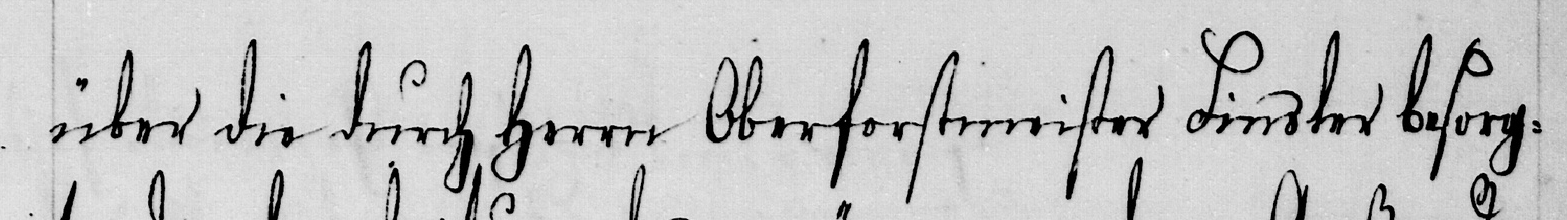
über die durch Herrn Oberforstmeister Finsler besor¬
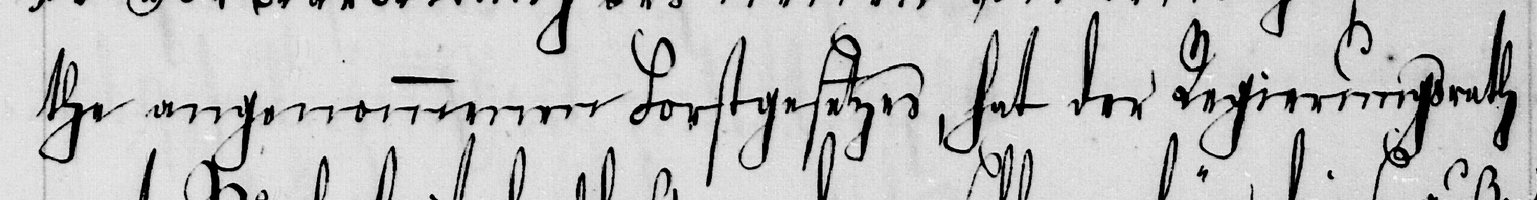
the angenommenen Forstgesetzes, hat der Regierungsrath
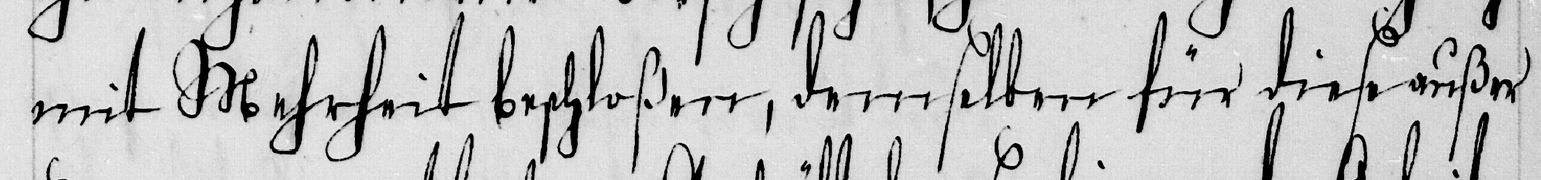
mit Mehrheit beschloßen, demselben für diese außer
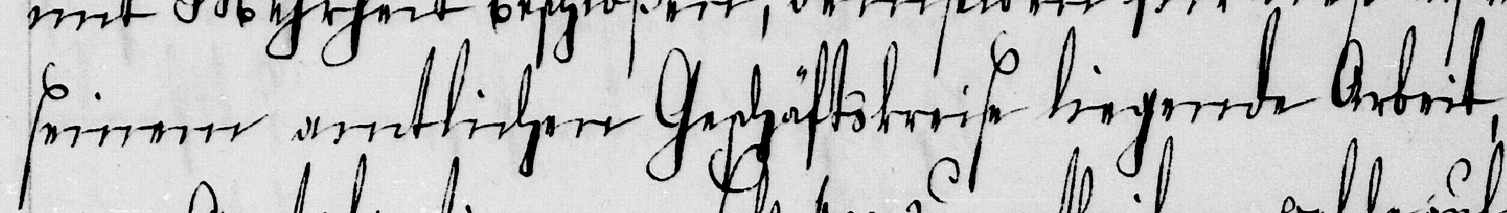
seinem amtlichen Geschäftskreise liegende Arbeit,
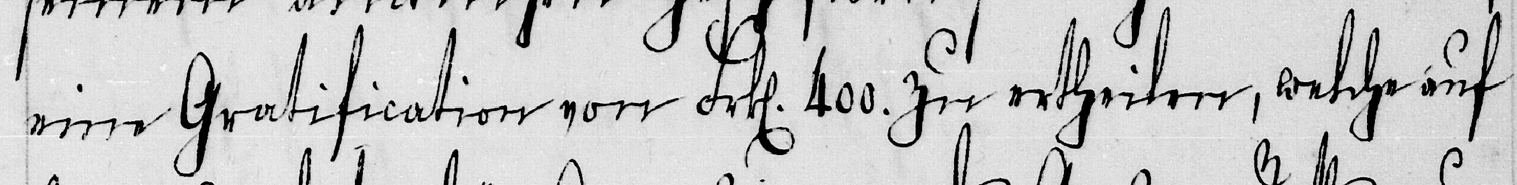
eine Gratification von Frk[en]. 400. zu ertheilen, welche auf
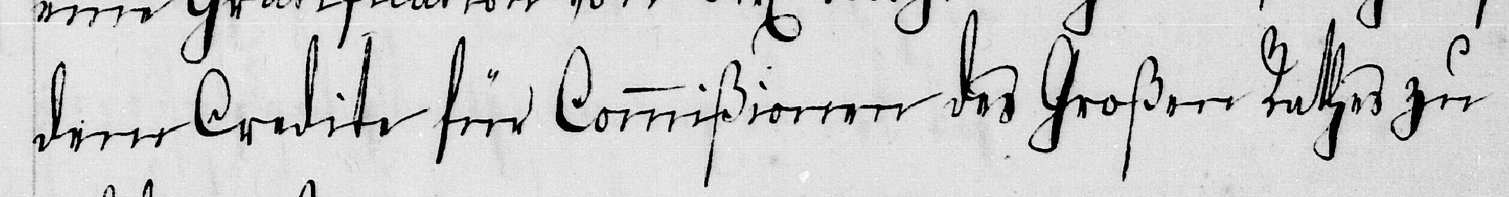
dem Credite für Commißionen des Großen Rathe zu
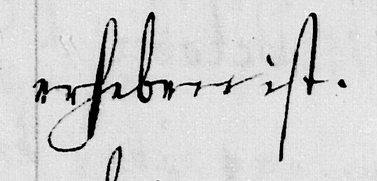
erheben ist.
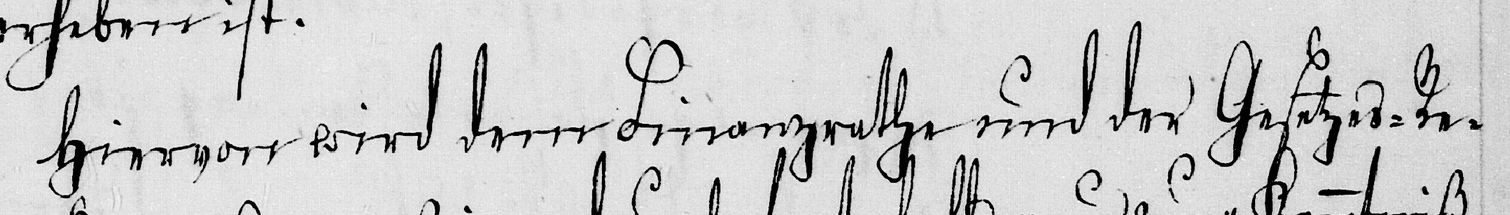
Hiervon wird dem Finanzrathe und der Gesetzes-Re¬
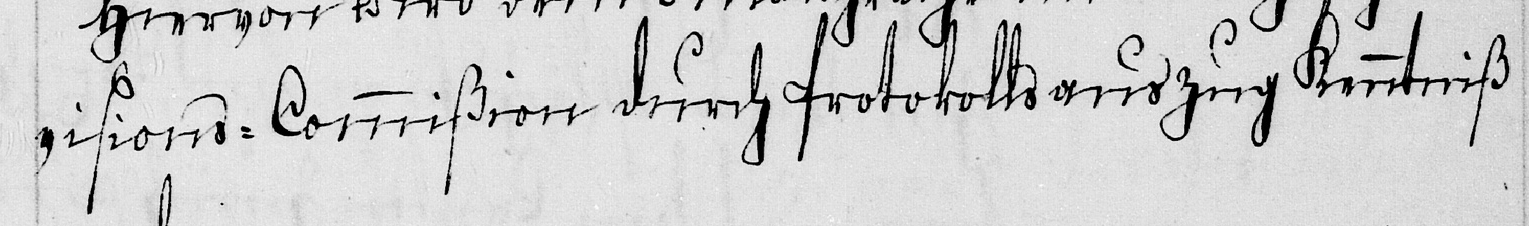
visions-Commißion durch Protokollsauszug Kenntniß
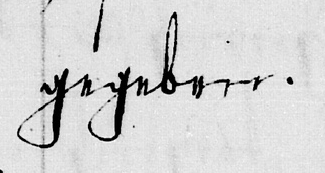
gegeben.
